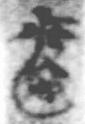○（箙）
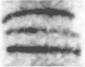三
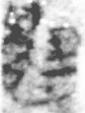○（貍）
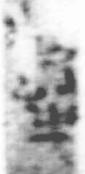○（貘）
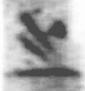之
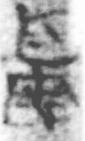聶（攝）
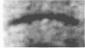一
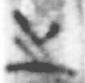之
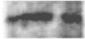一
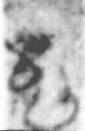○（貂）
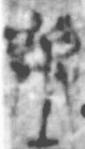與
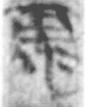彔（綠）
